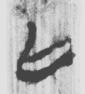㠯（以）
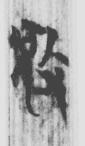敓
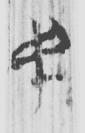民
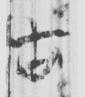古
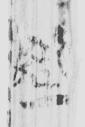地
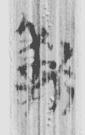{禾辛斤}
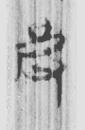皮
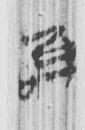唯
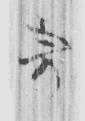先
